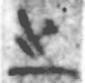之
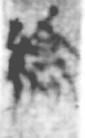縞
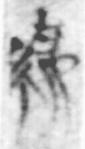綏
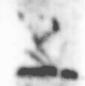之
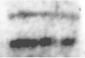二
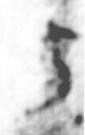紫
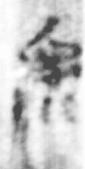○（紕）
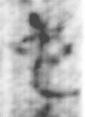屯
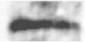一
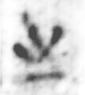之
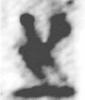之
